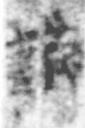○（鞁）
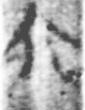六
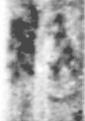○（轡）
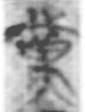黃
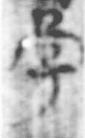○（娩）
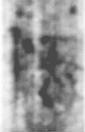所
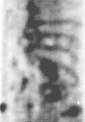馭（御）
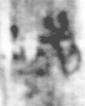軒
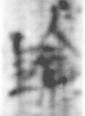輪
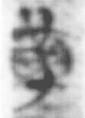革
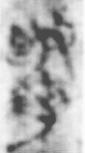弼
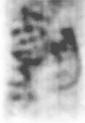韌
